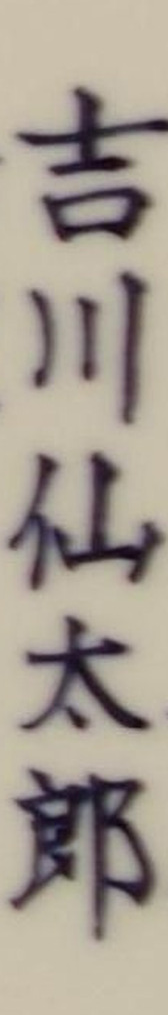吉川仙太郎
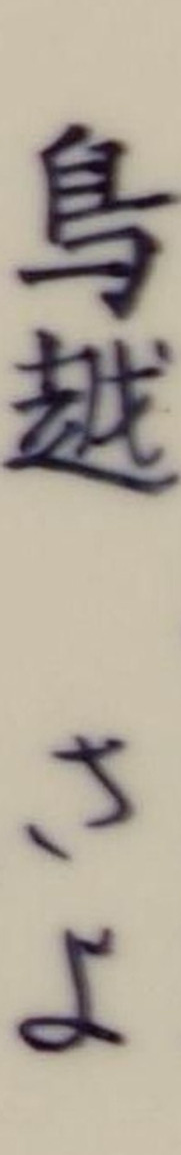鳥越さよ
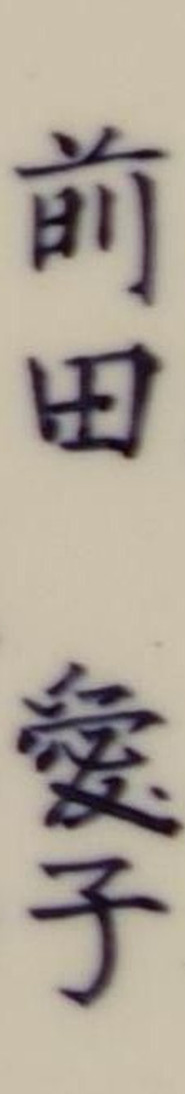前田愛子
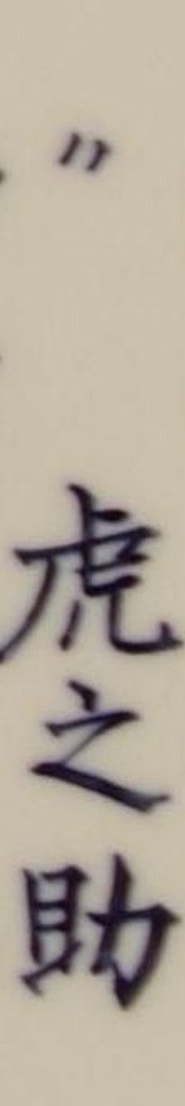虎之助
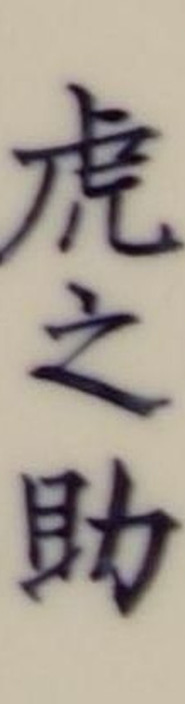虎之助
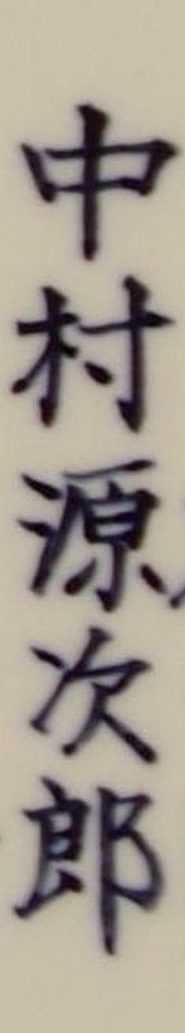中村源次郎
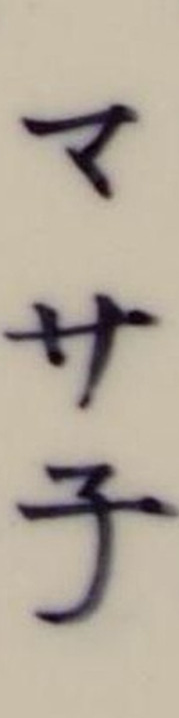マサ子
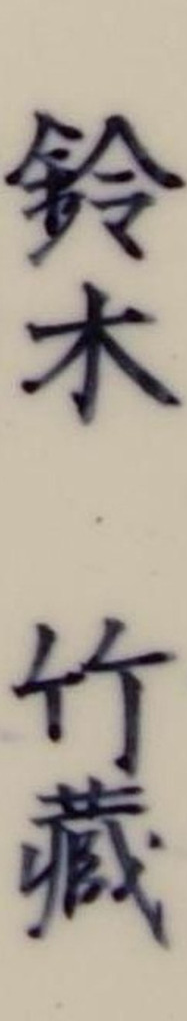鈴木竹蔵
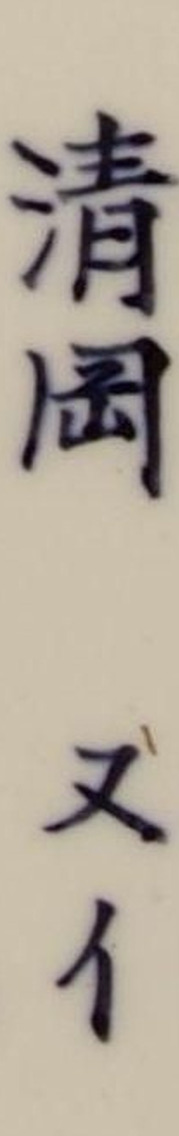清岡ヌイ
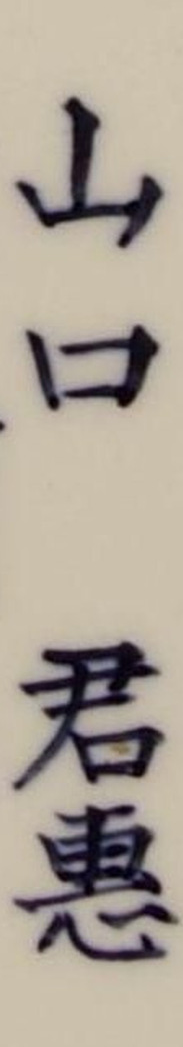山口君恵
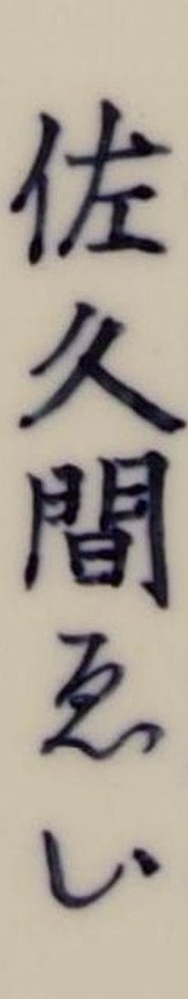佐久間えい
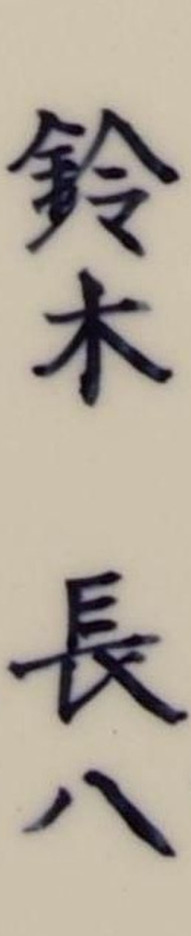鈴木長八
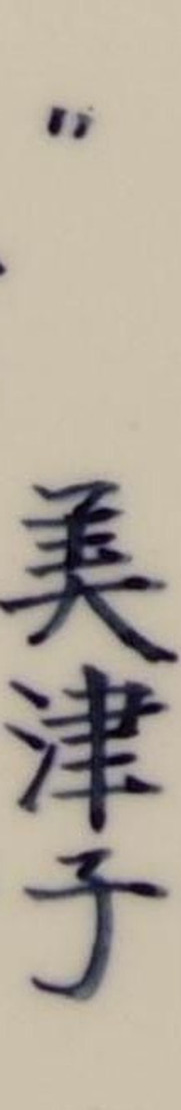美津子
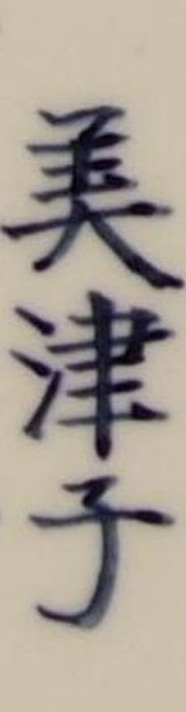美津子
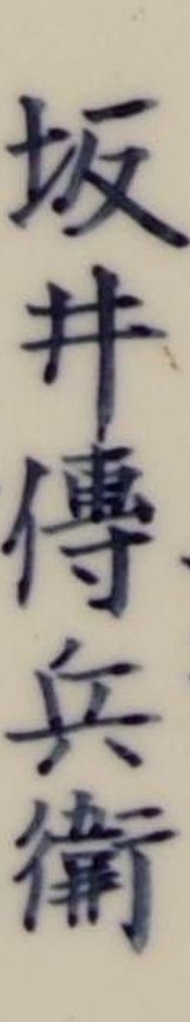坂井傳兵衛
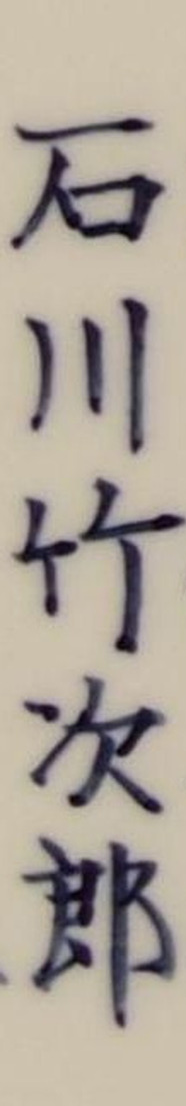石川竹次郎
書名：M~S
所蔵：高野山金剛峯寺
